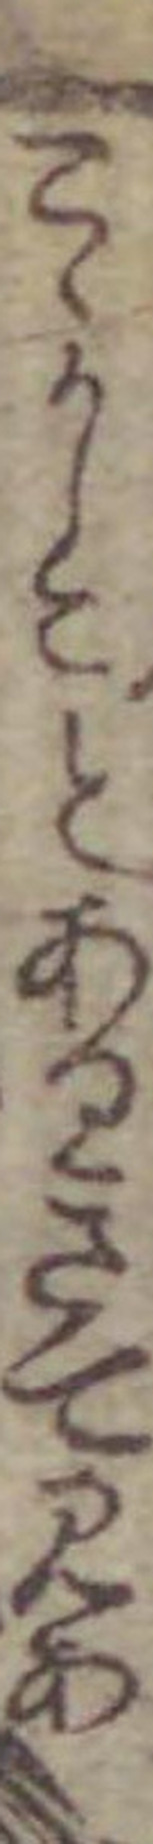こゝかしことあるきて見あ
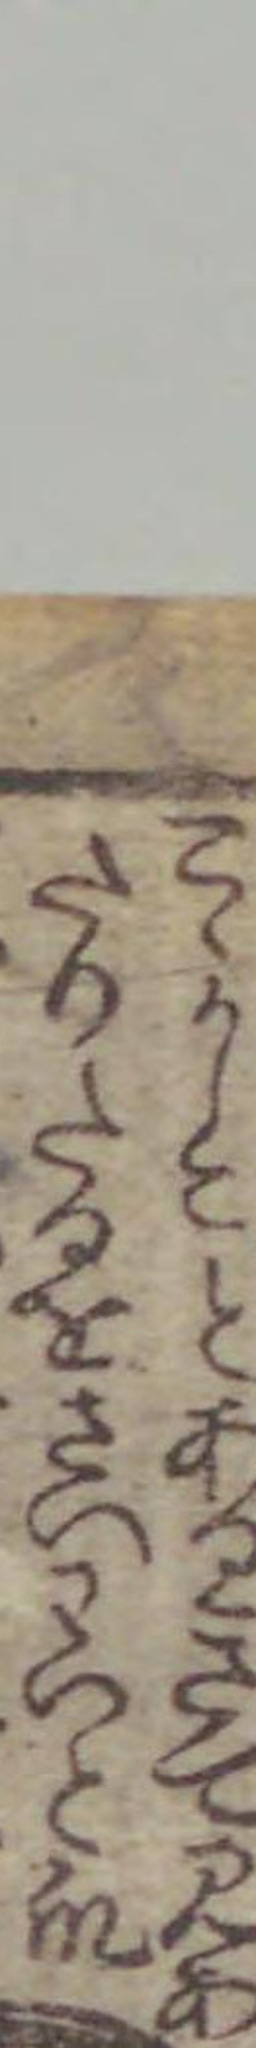たりたるをさいわいと瓜
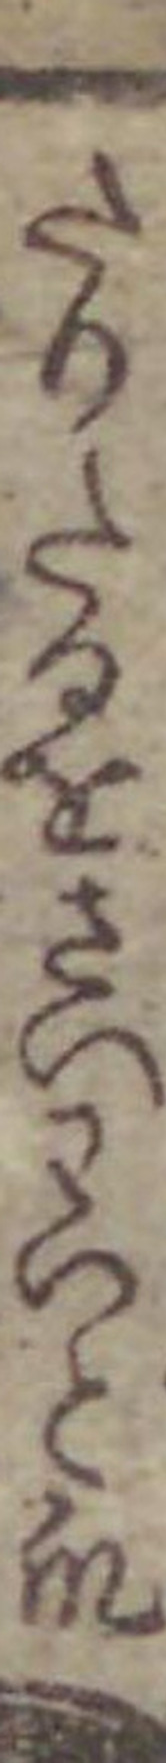たりたるをさいわいと瓜
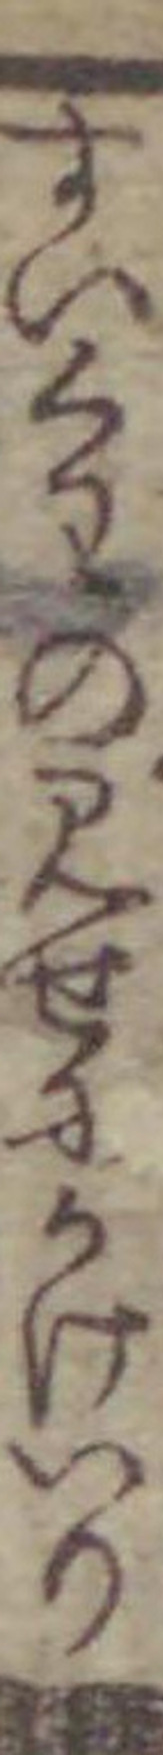すいくわの見世にかけいり
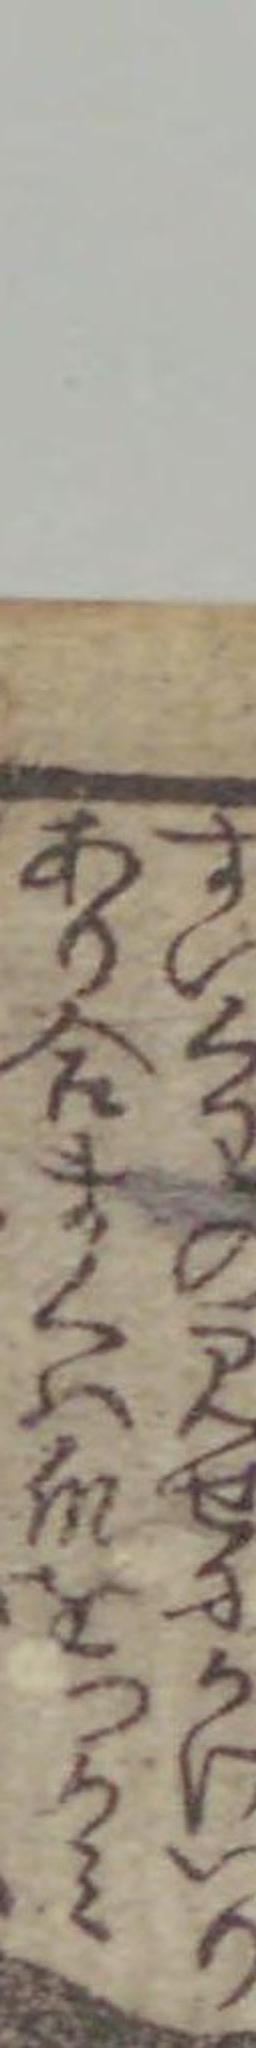あり合まくは瓜をつかみ
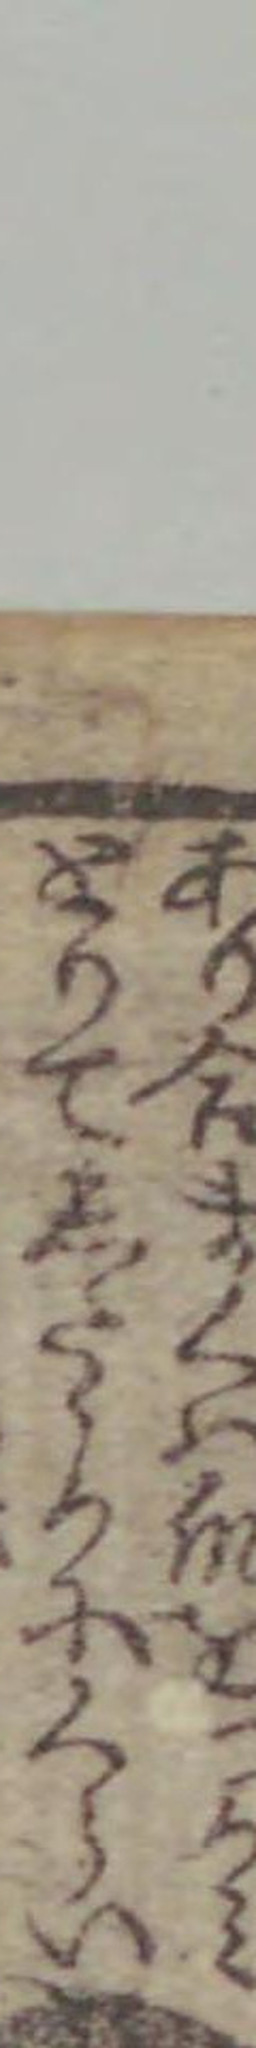とりてしたゝかにくらい
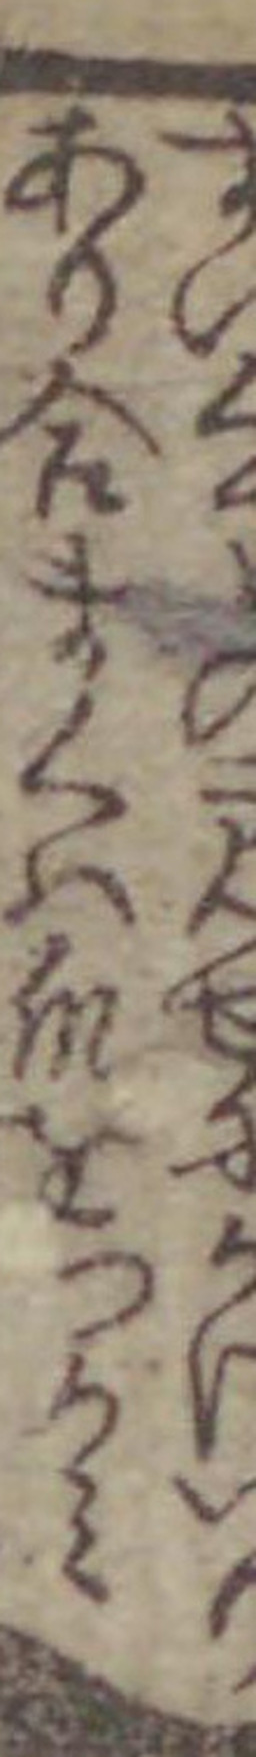あり合まくは瓜をつかみ
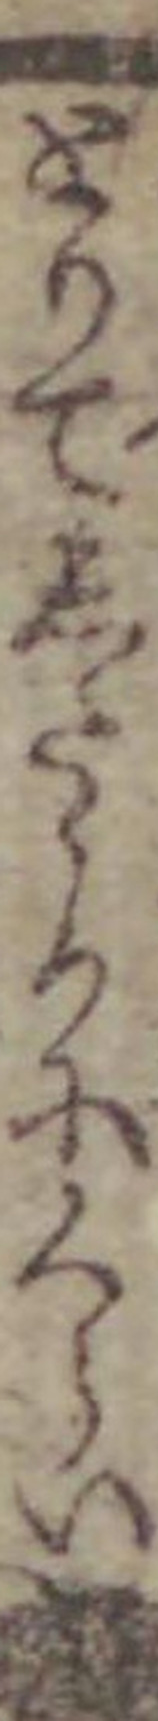とりてしたゝかにくらい
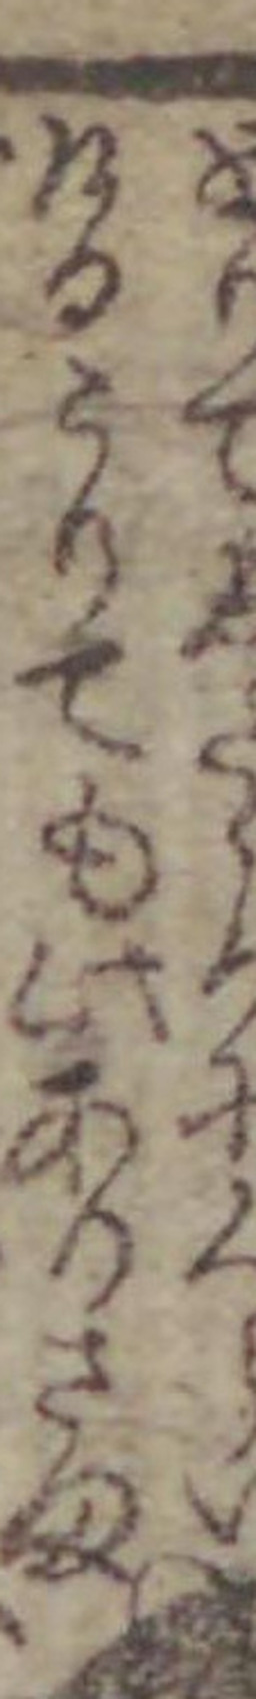けるうりても此ありさま
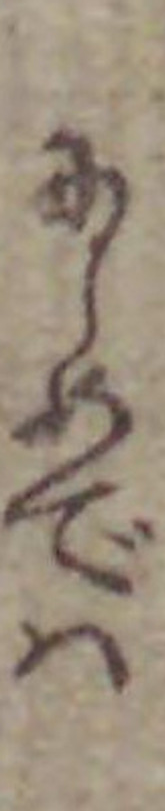にしめでは
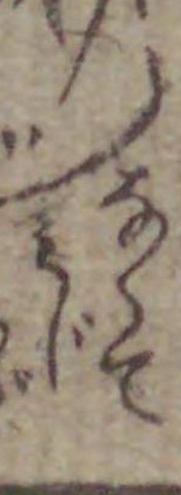なくて
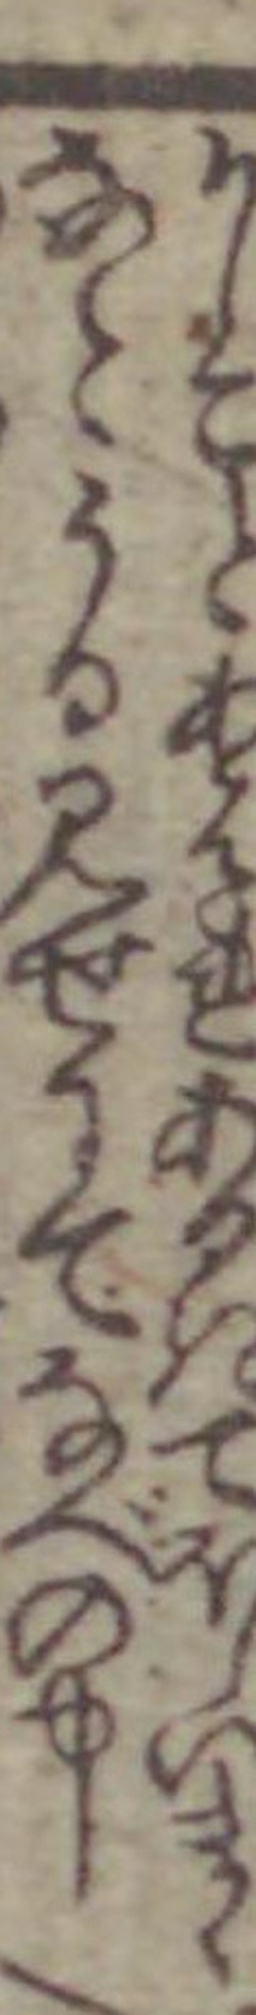なとうる見世にてなべの中
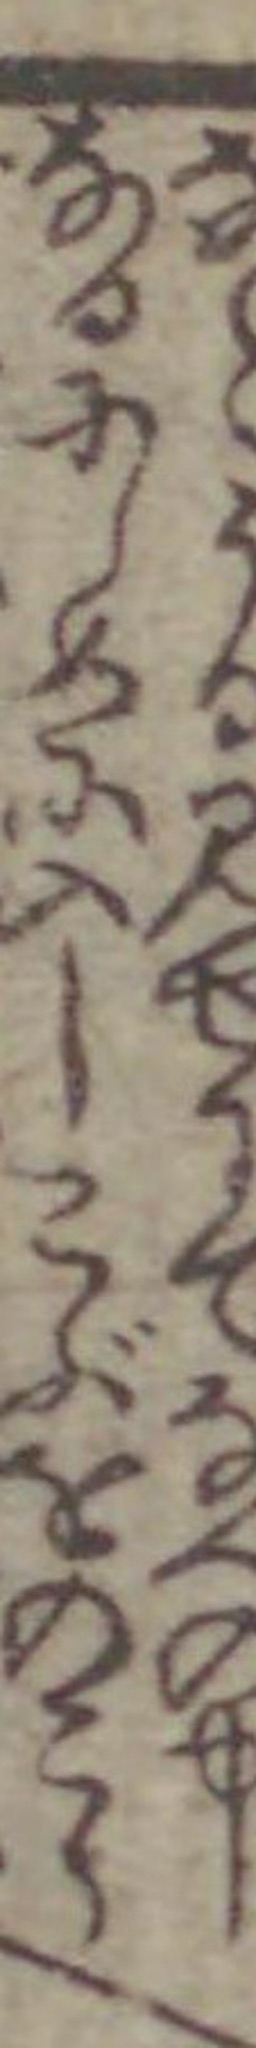なるにしめに入しこぶをのこら
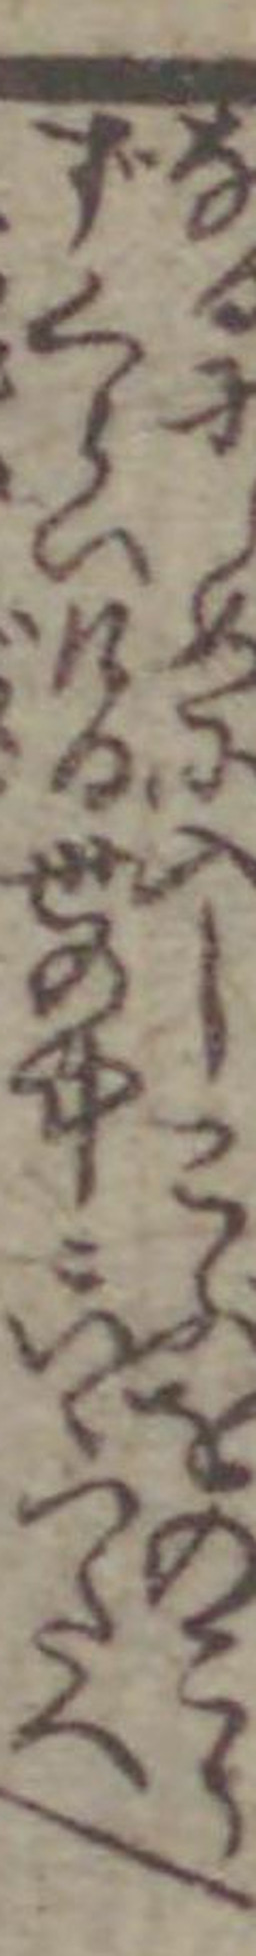ずくらいける世の中にいゝつたへ
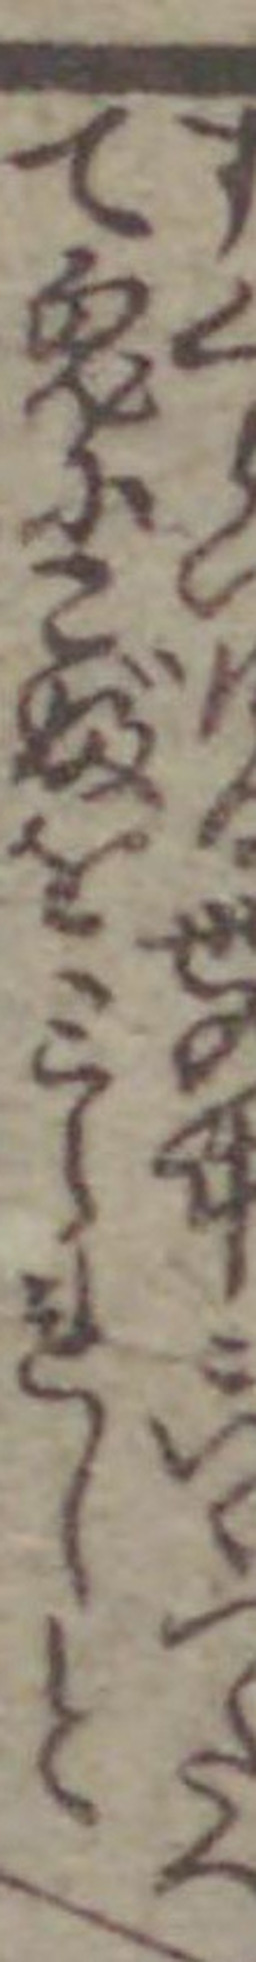て鬼にこぶをとられしと
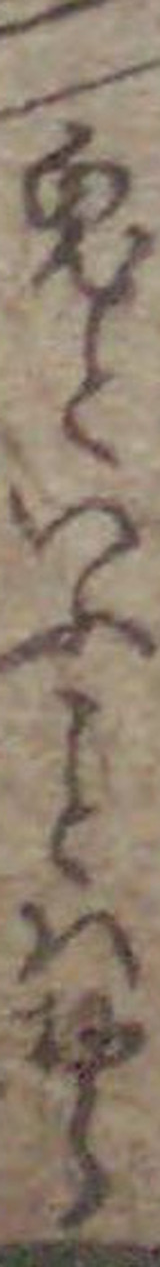鬼といふことはおら
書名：鬼の趣向草 2巻
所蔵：国立国会図書館 National Diet Library, JAPAN
